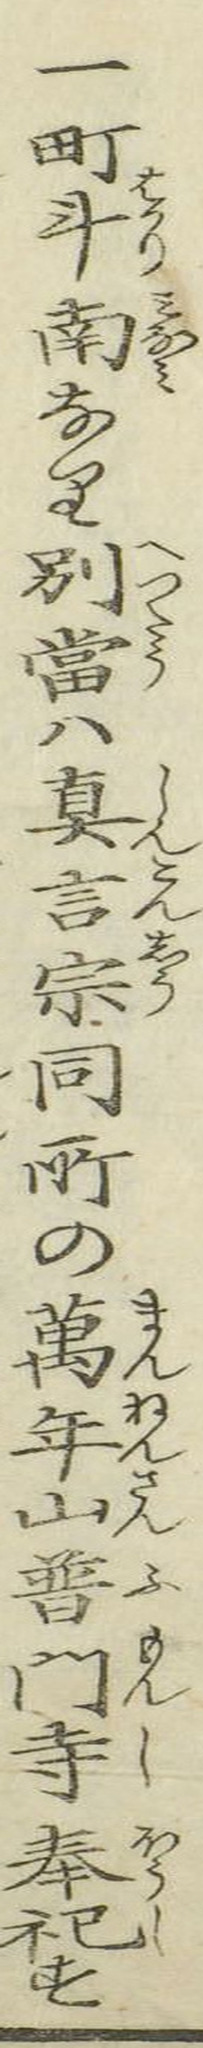一町斗南なり別當は真言宗同所の萬年山普門寺奉祀す
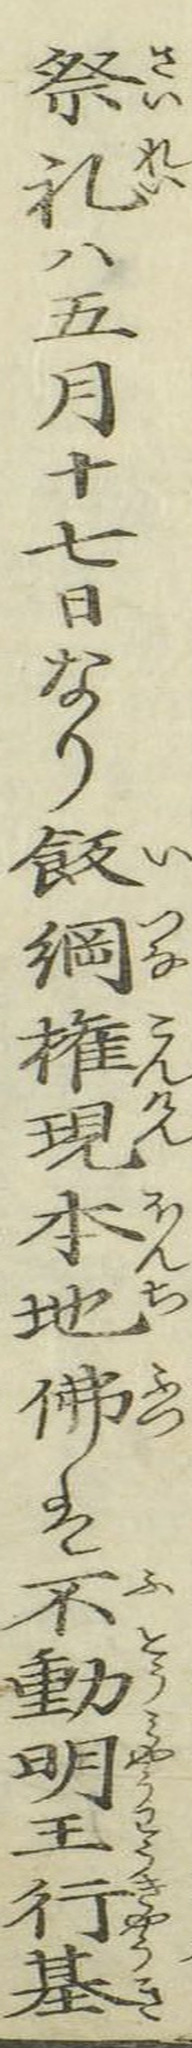祭礼は五月十七日なり飯綱権現本地佛は不動明王行基
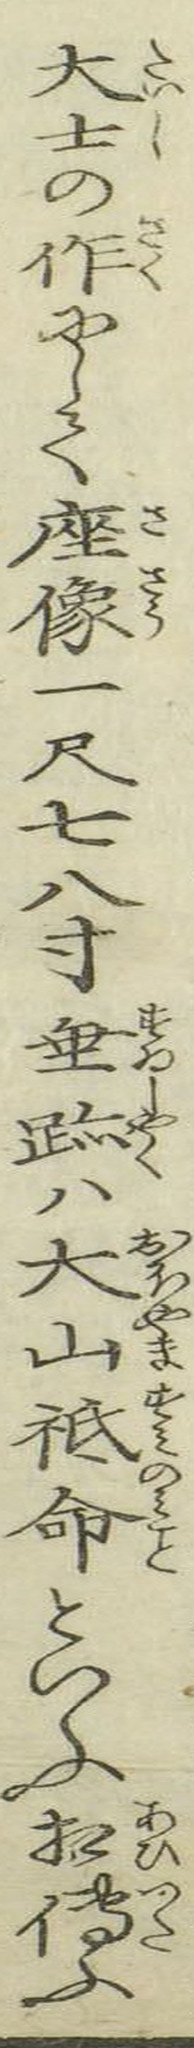大士の作にして座像一尺七八寸垂跡は大山祗命といふ相傳ふ
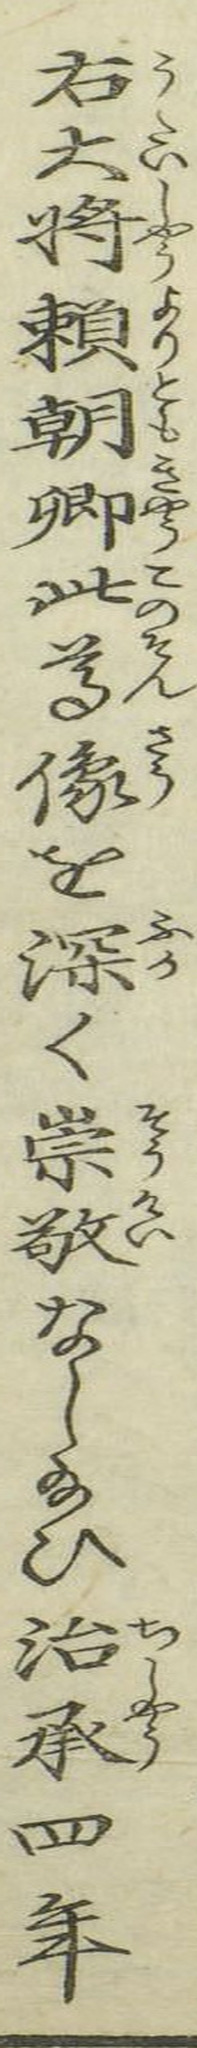右大将頼朝卿此尊像を深く崇敬なし給ひ治承四年

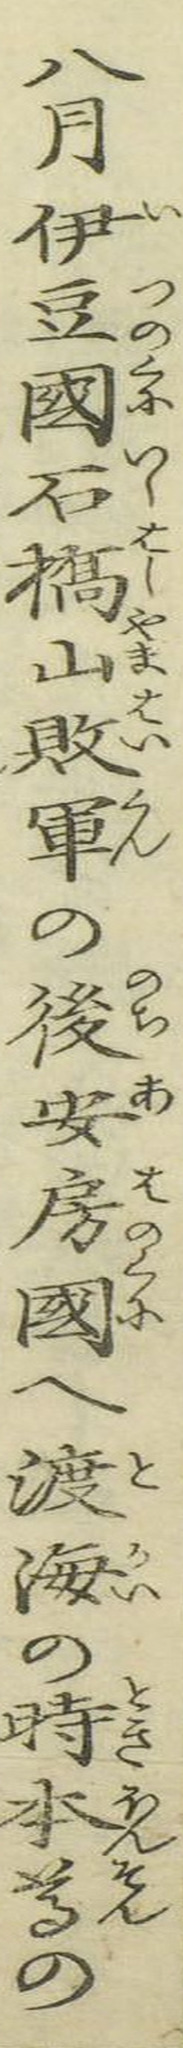八月伊豆國石橋山敗軍の後安房國へ渡海の時本尊の
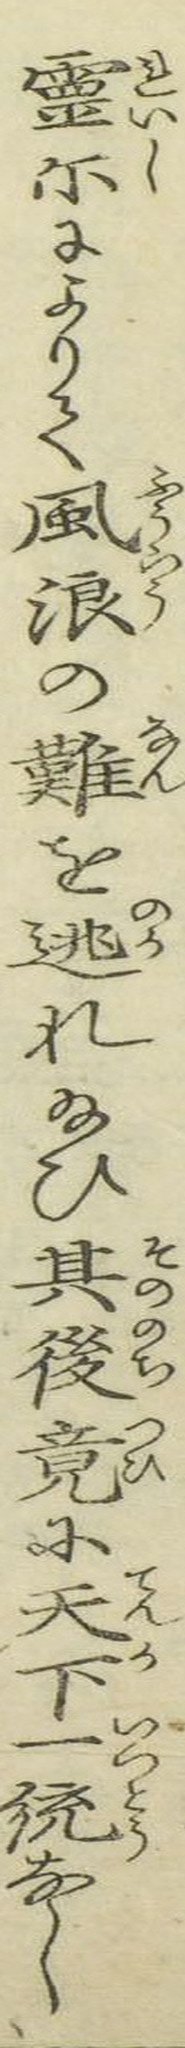霊尓によりて風浪の難を逃れ給ひ其後竟に天下一統なし
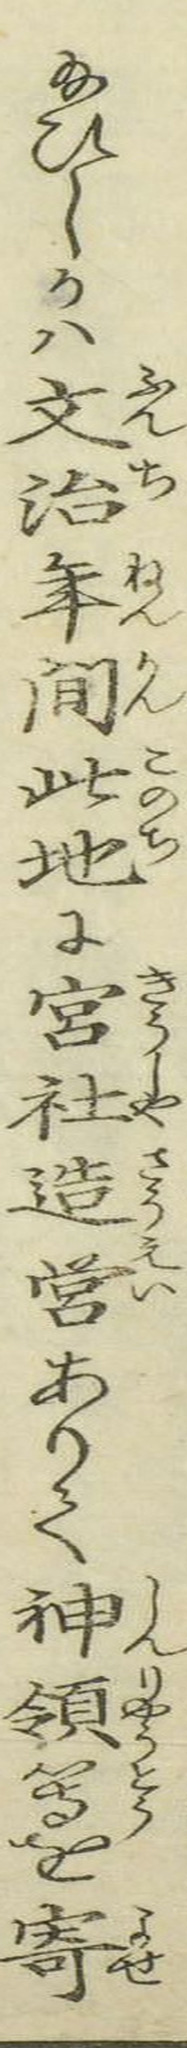給ひしかは文治年間此地に宮社造営ありて神領等を寄
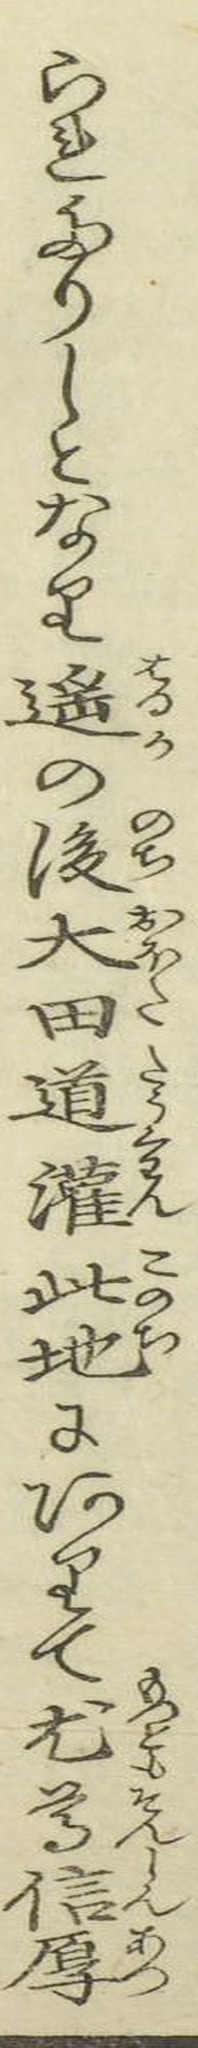られたりしとなり遥の後大田道灌此地にありて尤尊信厚
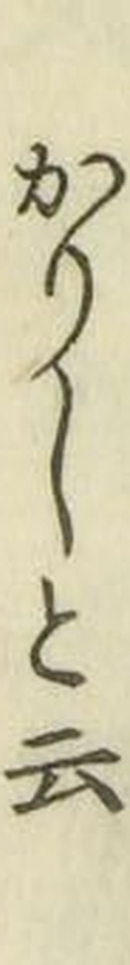かりしと云
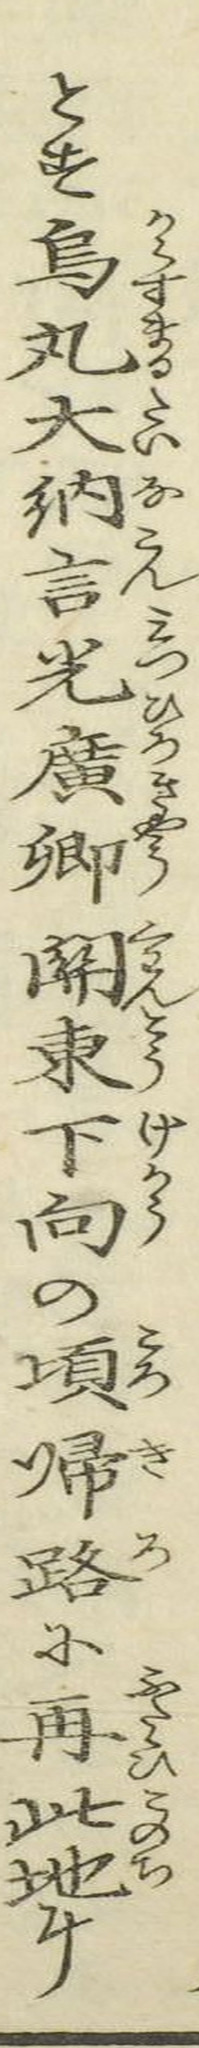とす烏丸大納言光廣卿関東下向の頃帰路に再此地に
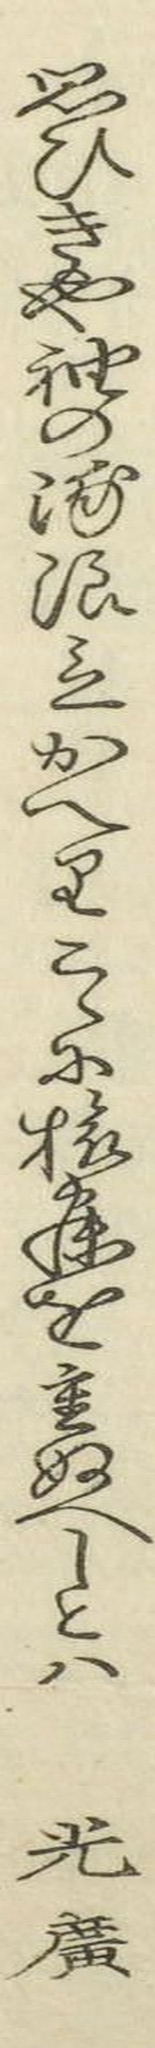思ひきや袖の浦浪立かへりこゝに旅宿を重ぬへしとは光廣
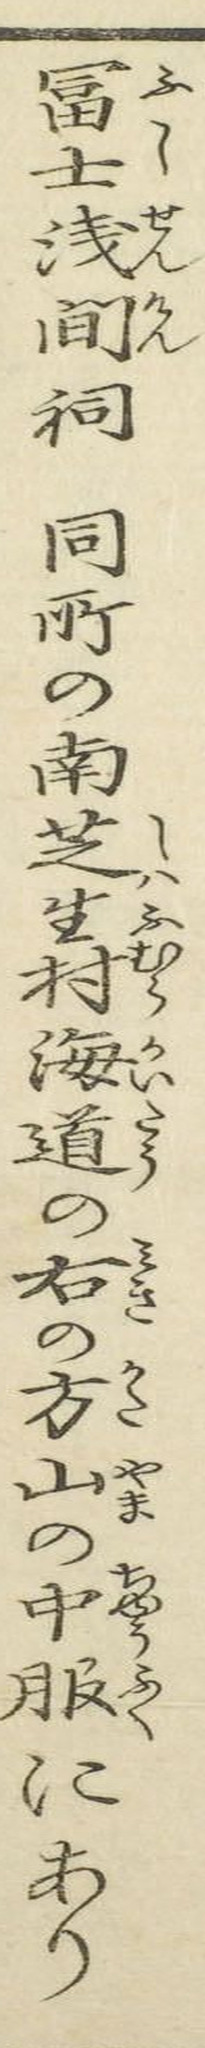冨士浅間祠同所の南芝生村海道の右の方山の中腹にあり
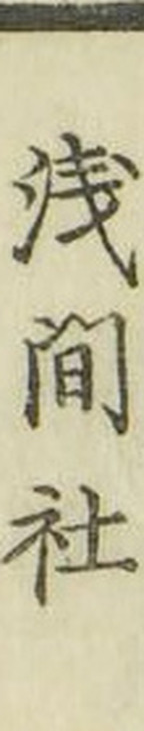浅間社

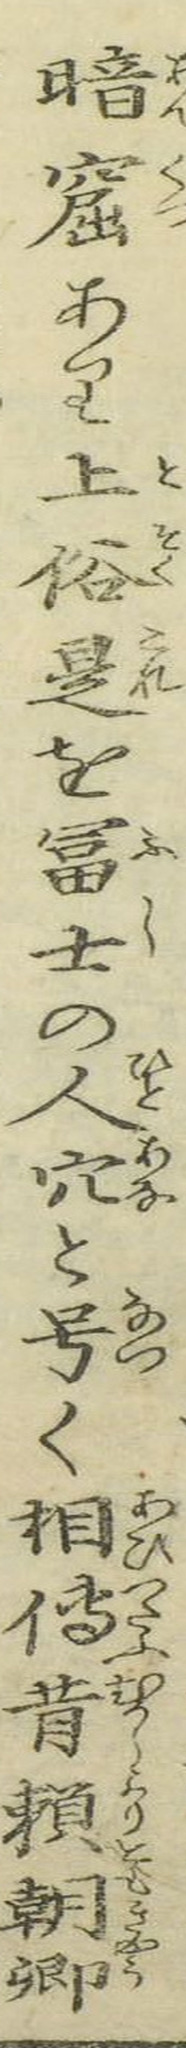暗窟あり土俗是を冨士の人穴と号く相傳昔頼朝卿
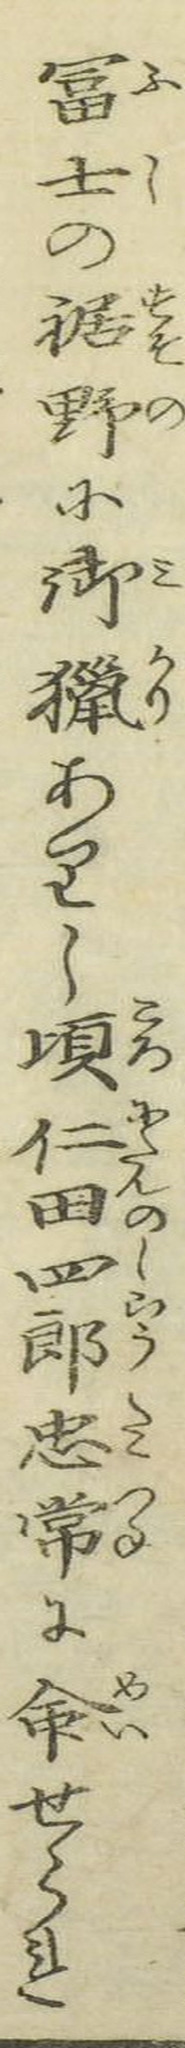冨士の裾野に御獵ありし頃仁田四郎忠常に命せられ
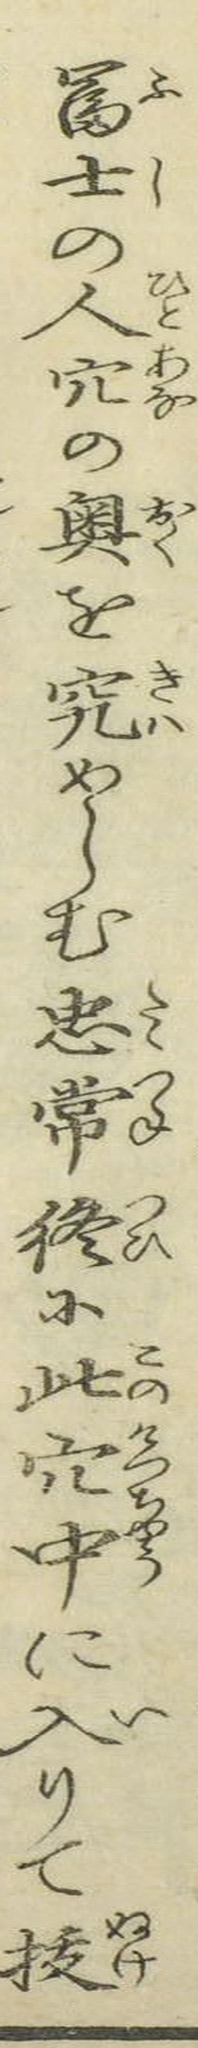冨士の人穴の奥を究めしむ忠常終に此穴中に入りて抜
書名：江戸名所図会 20巻 巻之5
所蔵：東京学芸大学教育コンテンツアーカイブ
